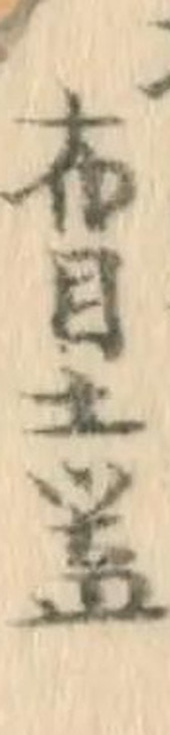布目土器
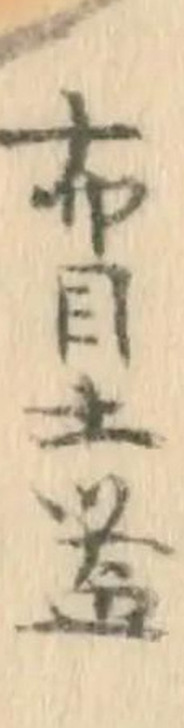布目土器
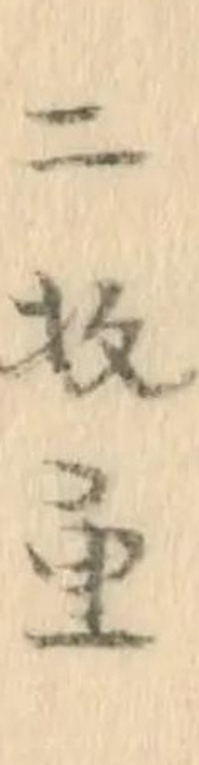二枚重

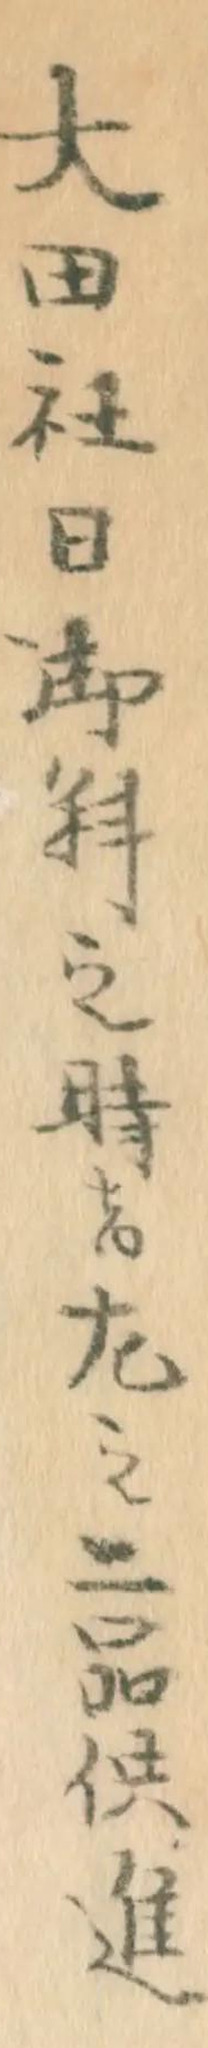大田社日御料之時者左之二品供進
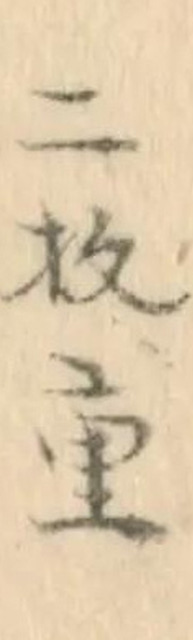二枚重
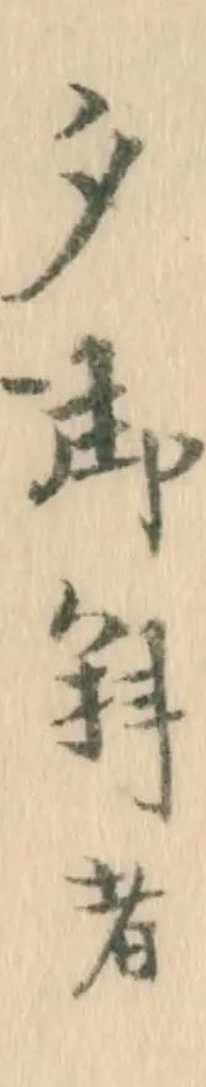夕御料者
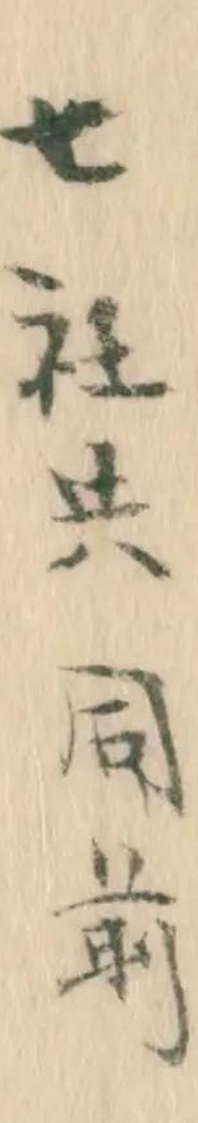七社共同前
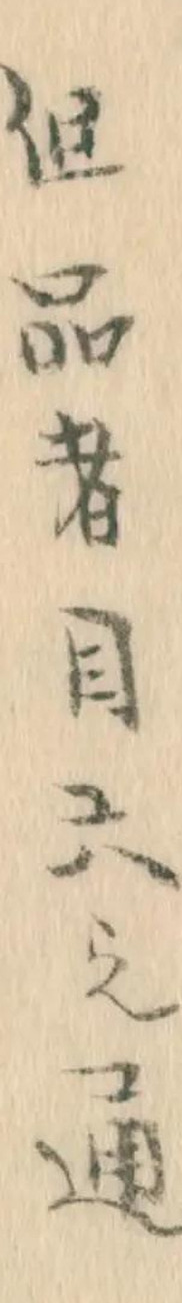但品者目六之通
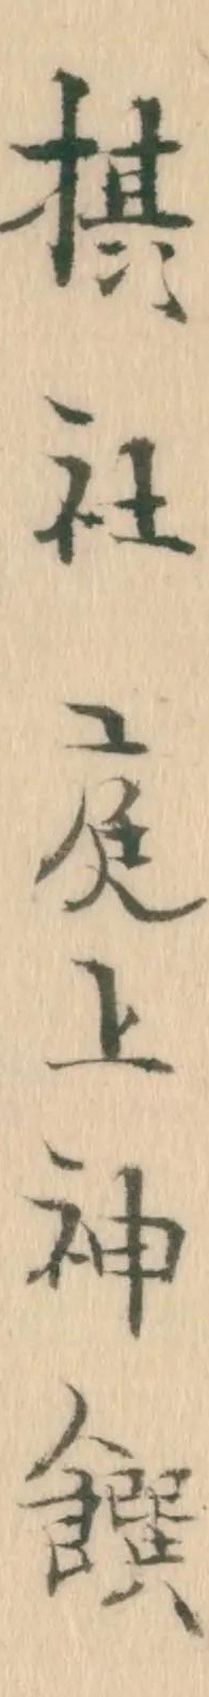摂社庭上神饌
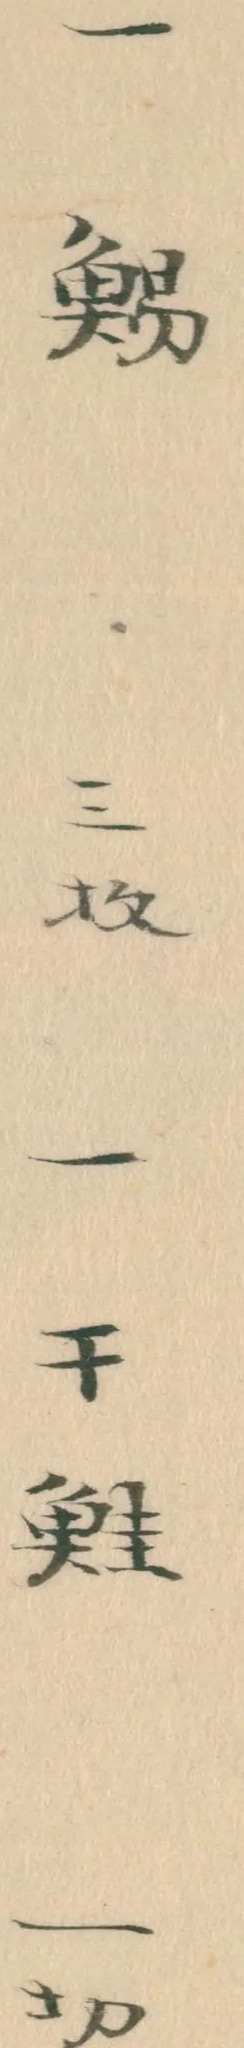一鯣三枚一干鮭一切
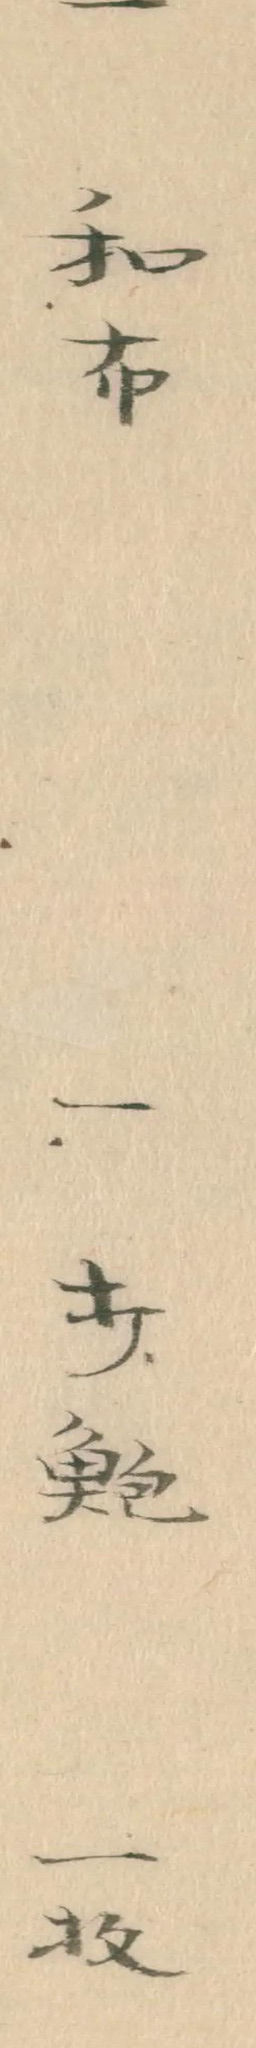一和布一打鮑一枚
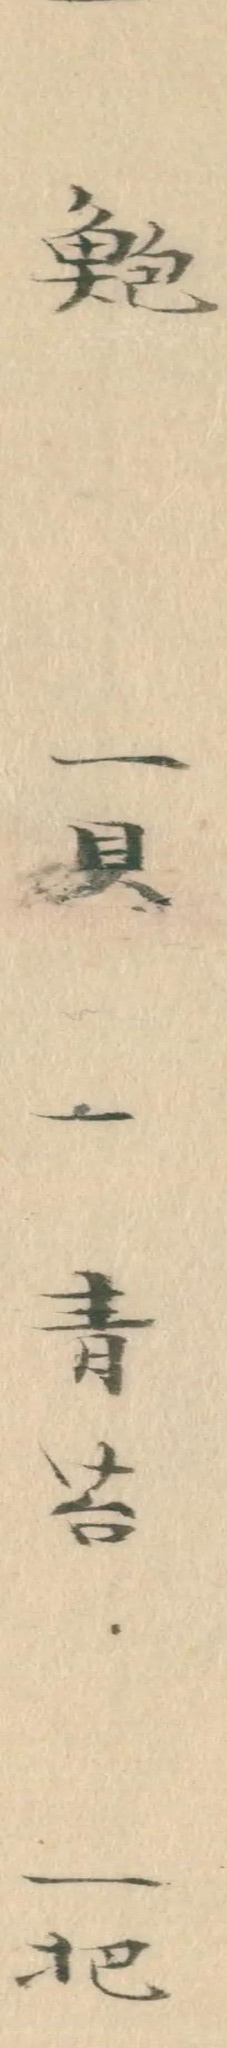一鮑一具一青苔一把
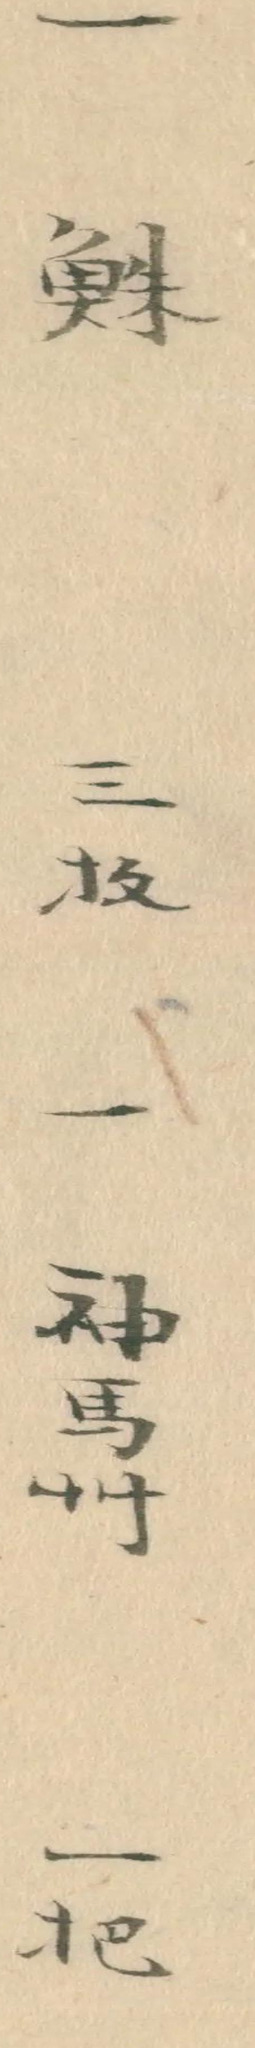一鮢三枚一神馬艸一把
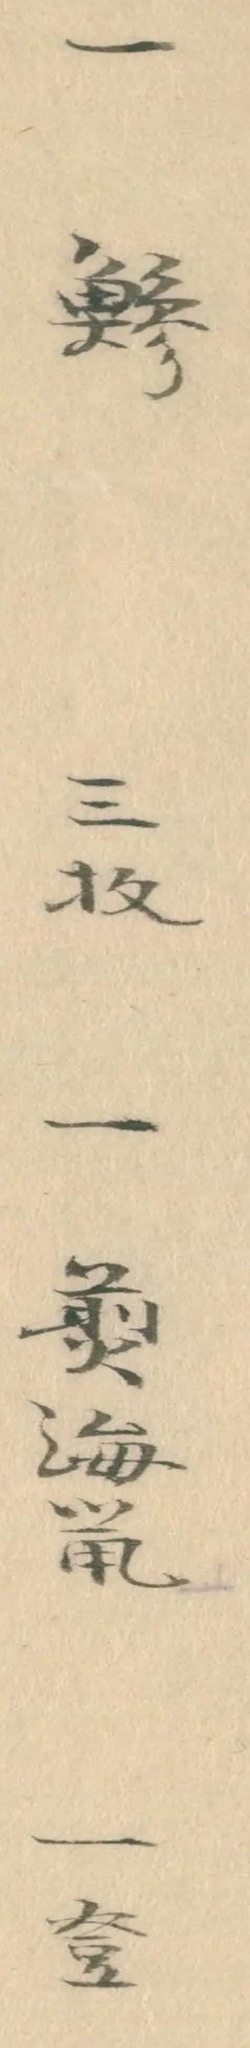一鰺三枚一煎海鼠一登
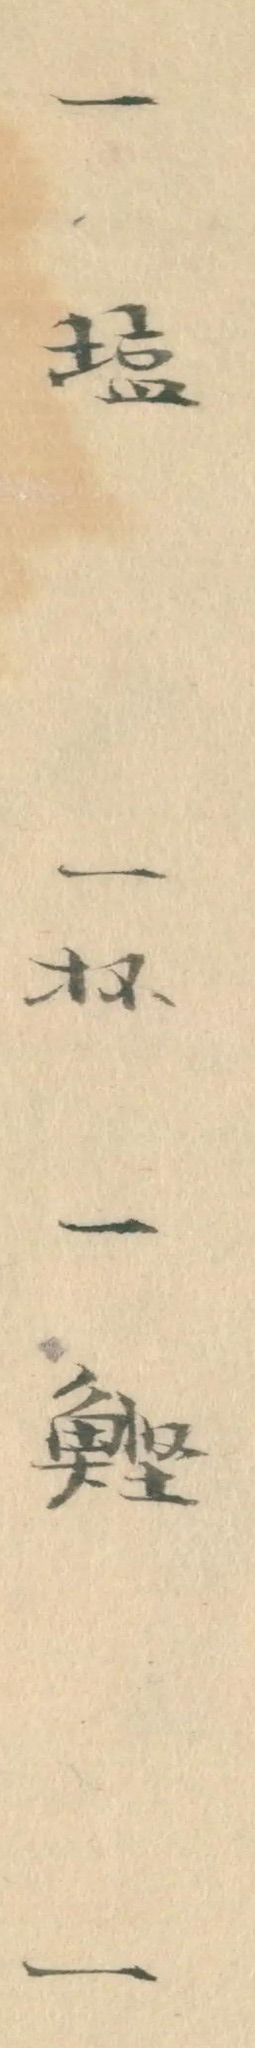一塩一抔一鰹一切
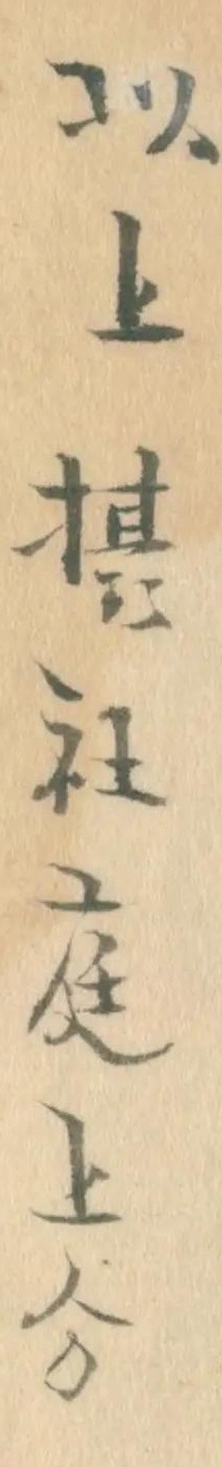以上摂社庭分
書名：葵御祭供進之神饌諸品色目書
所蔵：国立国会図書館 National Diet Library, JAPAN
